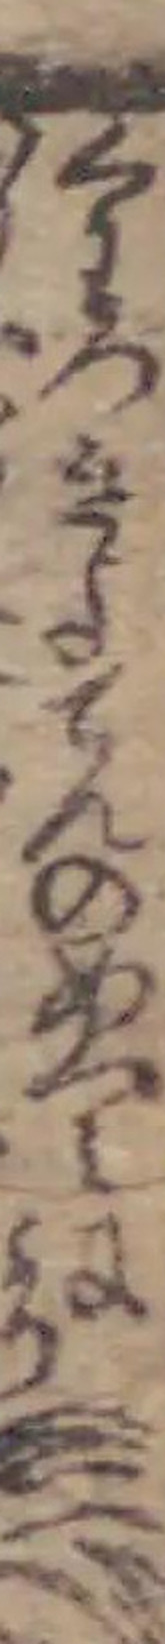くわつきよてんのめくみにより
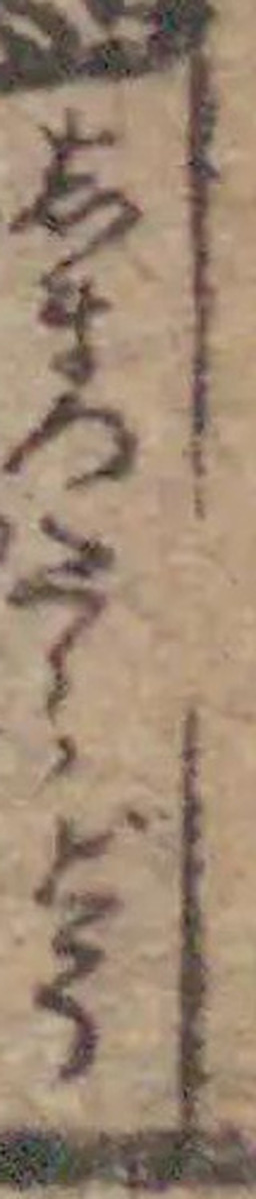しまつたらどう
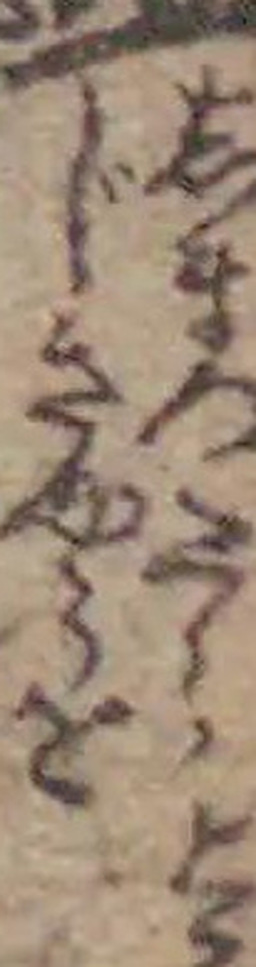じきやうを
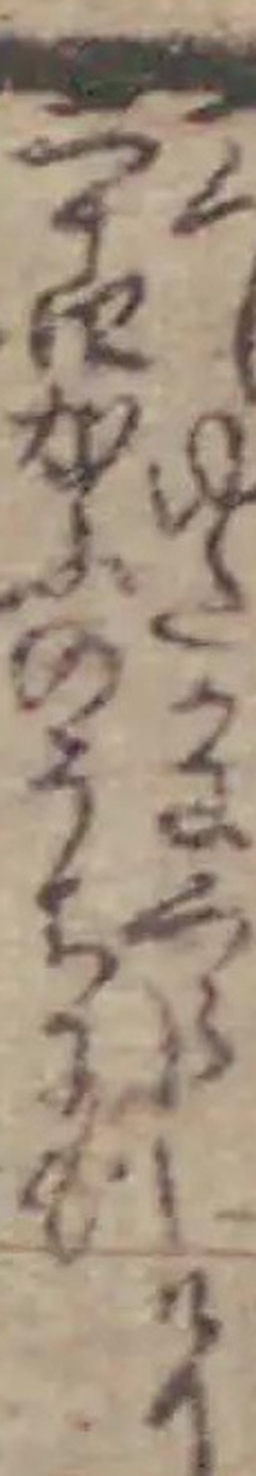二十四かふのうちにも
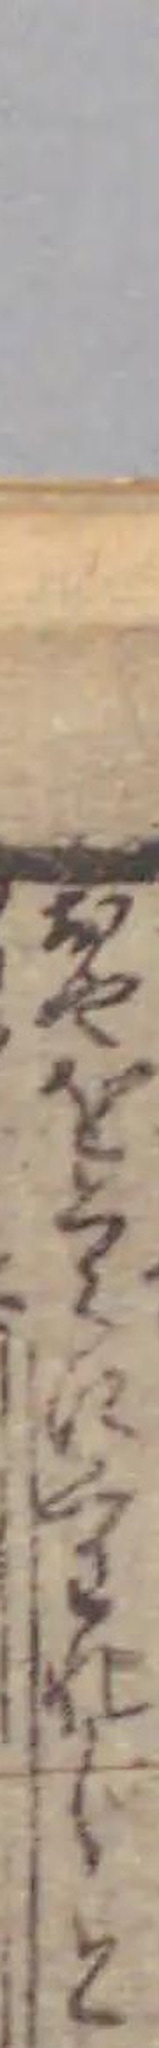おやをとらにくわれじと
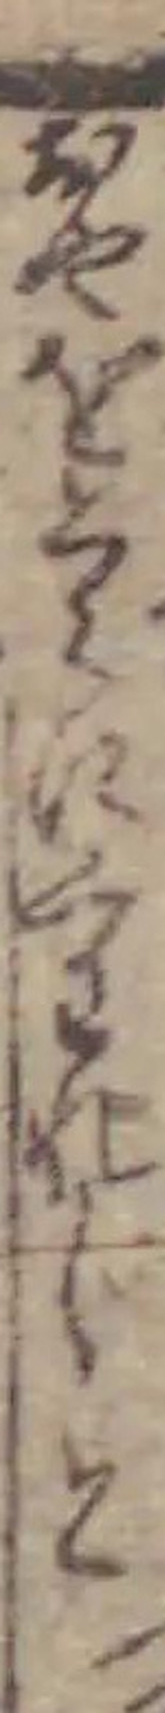おやをとらにくわれじと
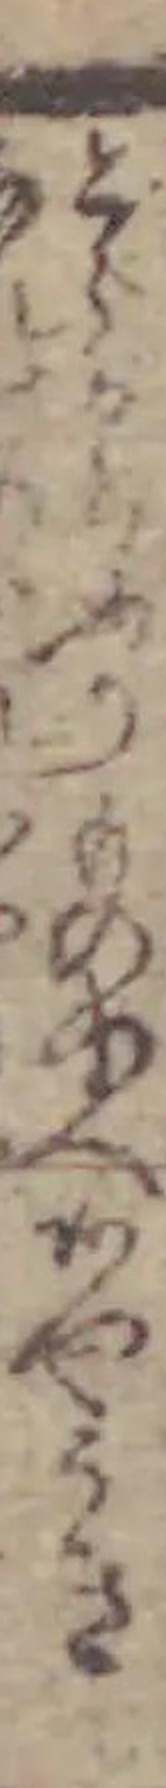とらかとふりものゆへあやうき
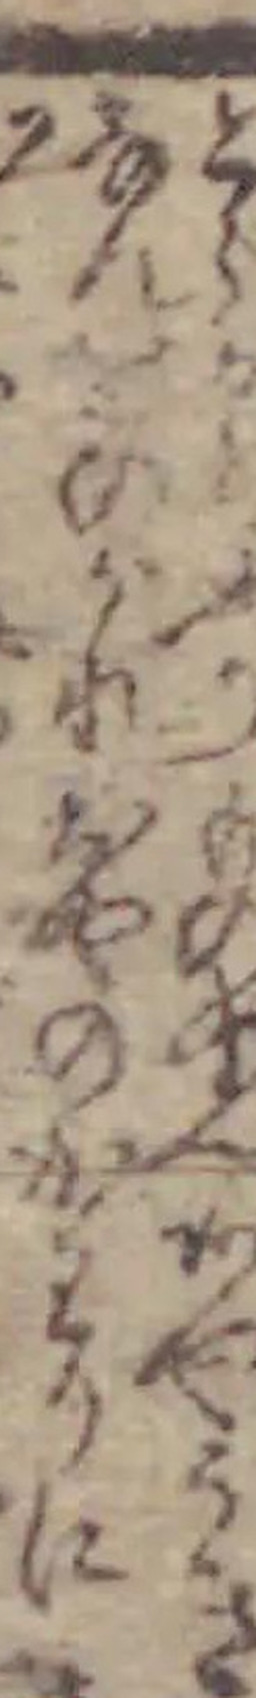なんをのがれおやのかわりに
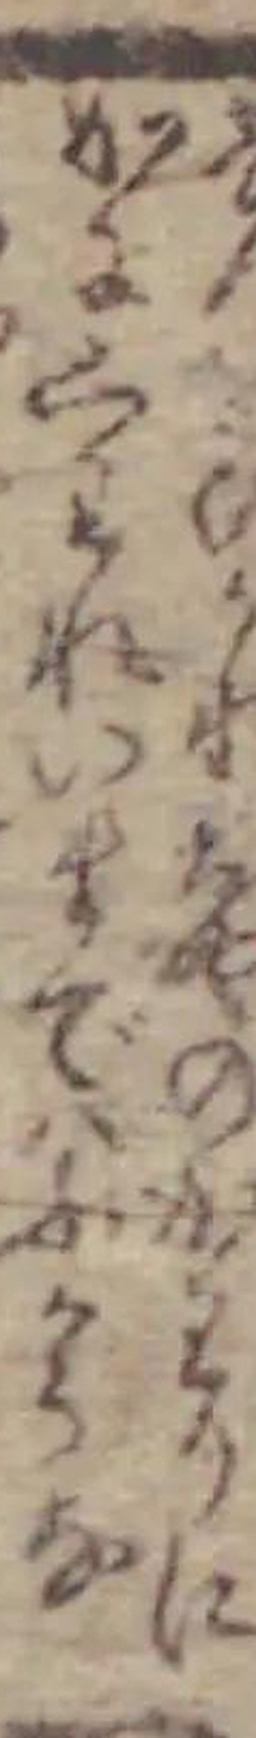かにくわれいまではふかうな
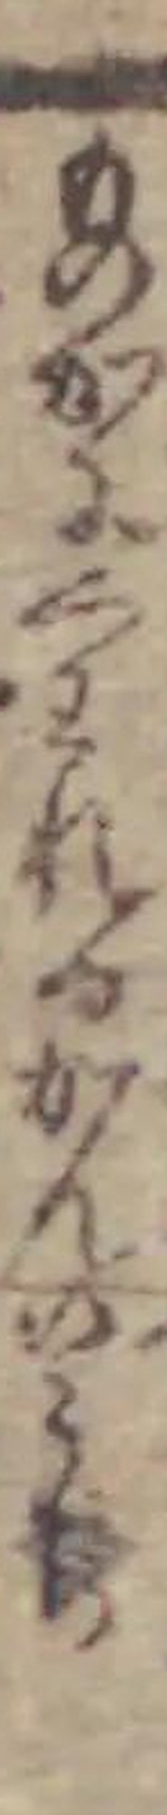ものかにくわれるかんのうち
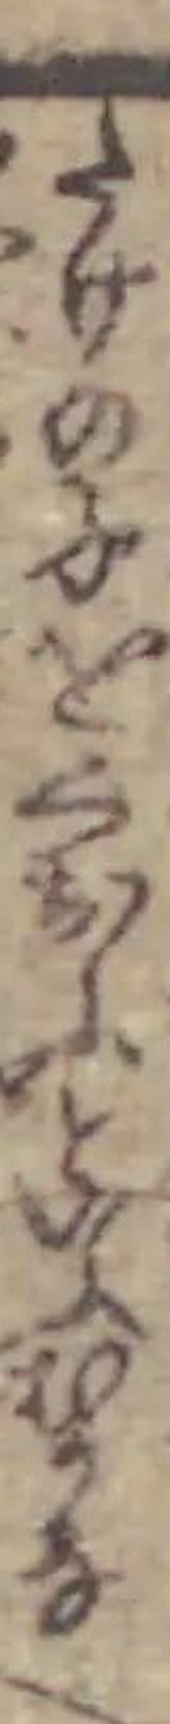たけの子をくおふといふむりな
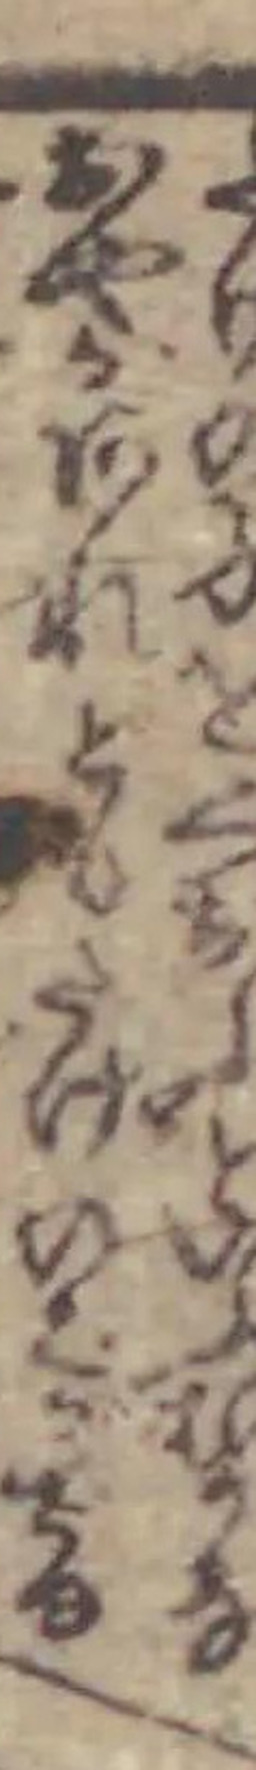おやがあれどもたけのこがでる
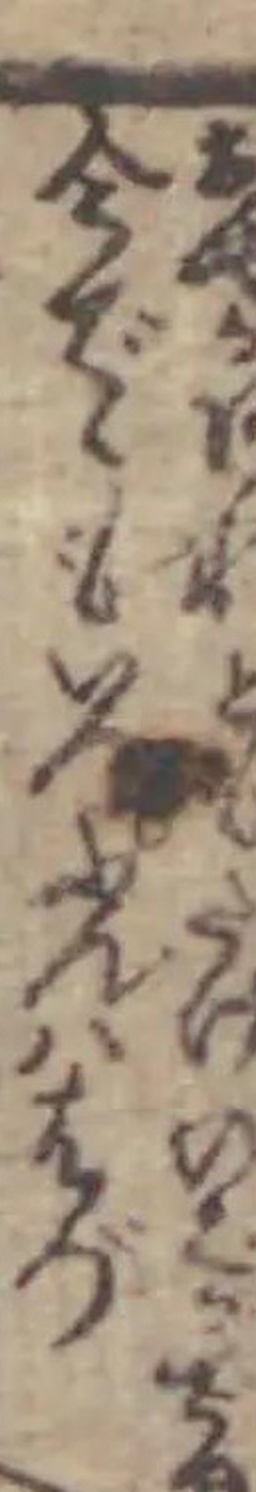今でゝもいつふんははづ
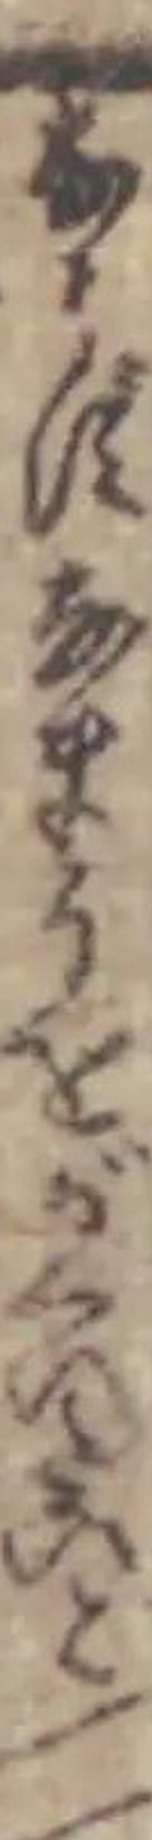ならずなまうをがくいたいと
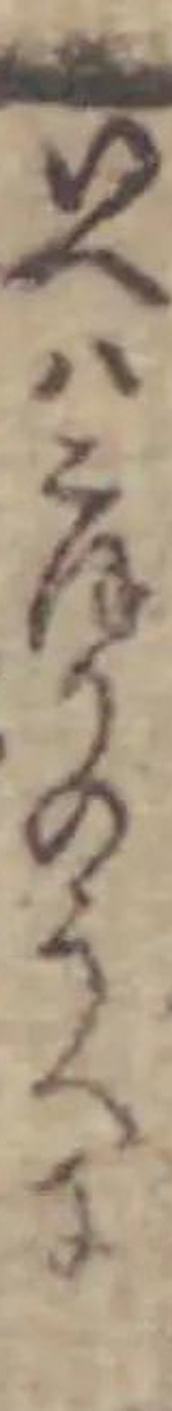いへはこほりのうへに
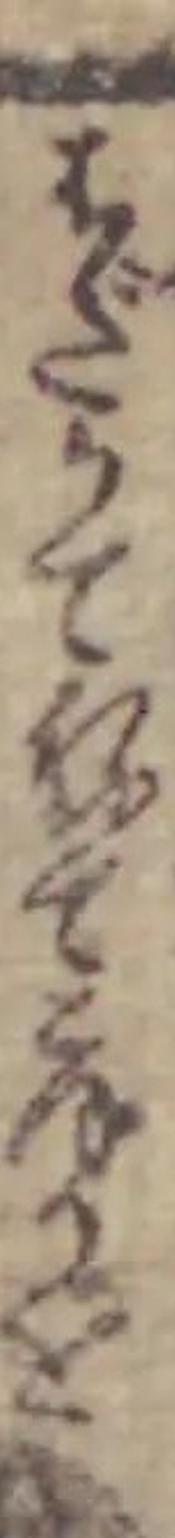はだかてねてこほりを
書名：間違月夜鍋 2巻
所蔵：国立国会図書館 National Diet Library, JAPAN
